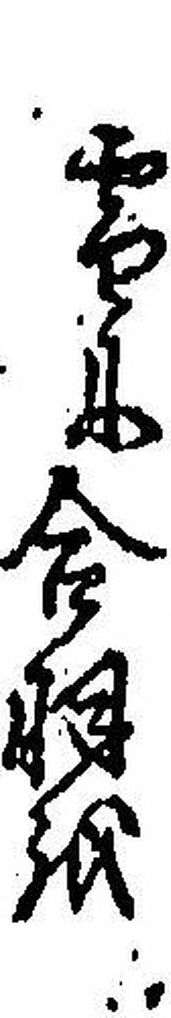雪に合羽を
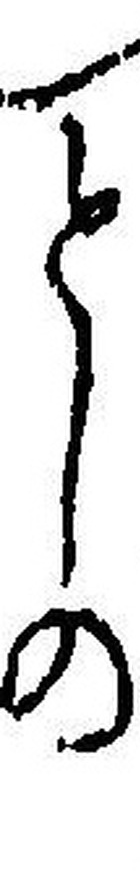としの
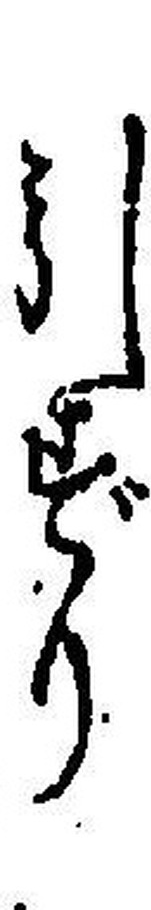引ずり
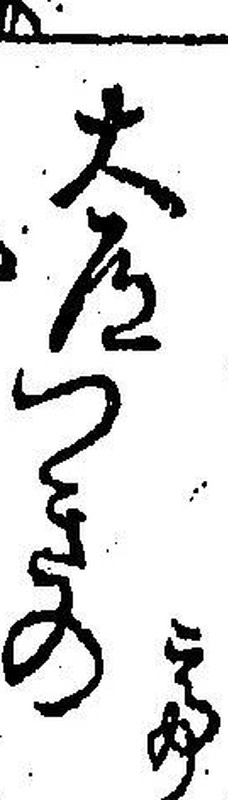大道つきの
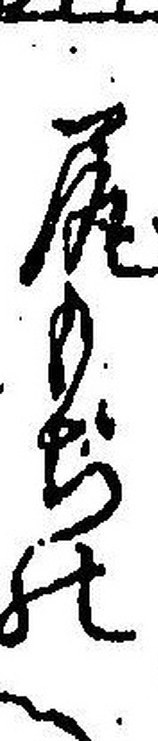尻もちの
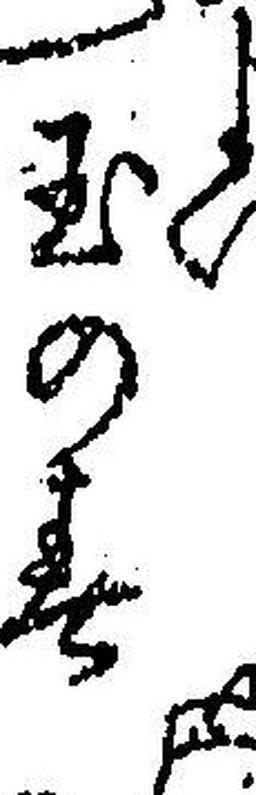玉の春
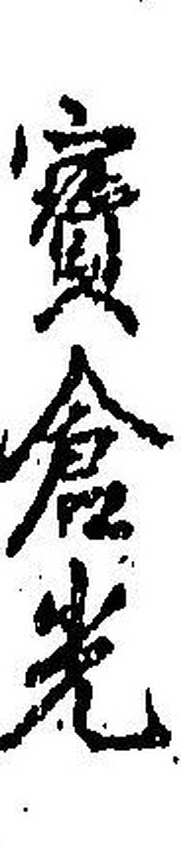宝倉光
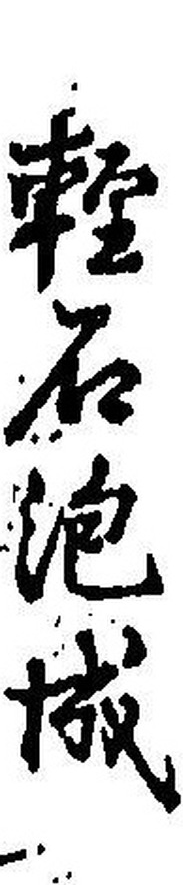軽石泡成
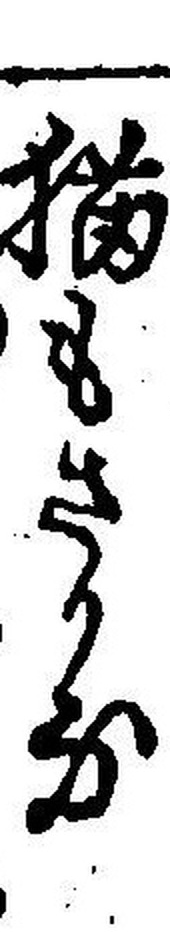猫もさかな
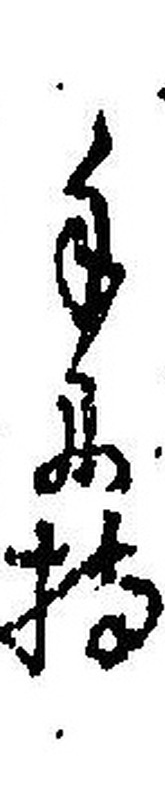手に持
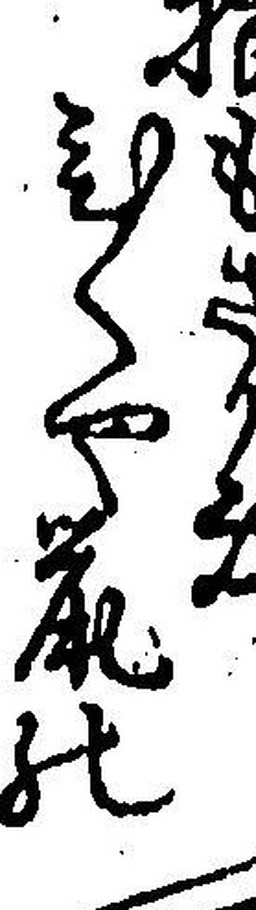ひくや鼠の
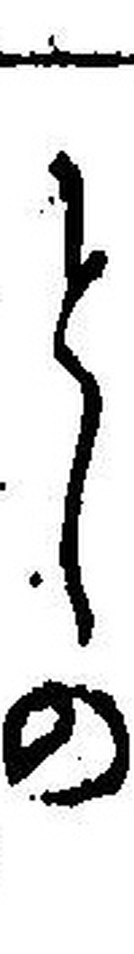としの
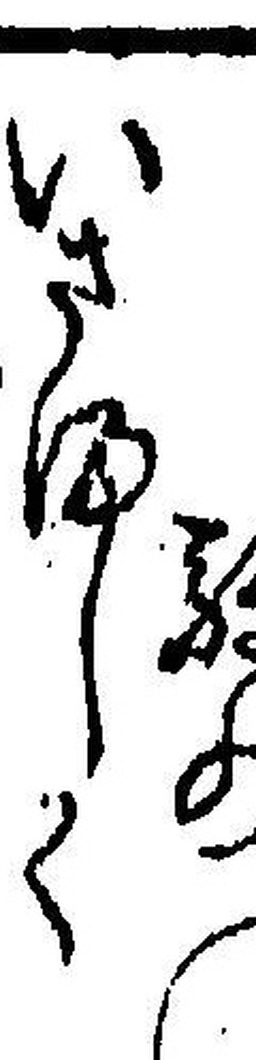いさましく
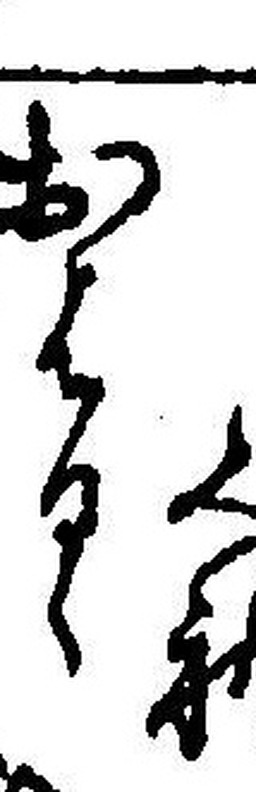おはるゝ
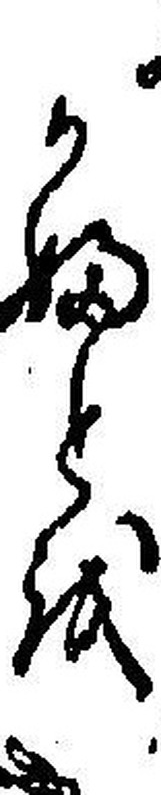かふとを
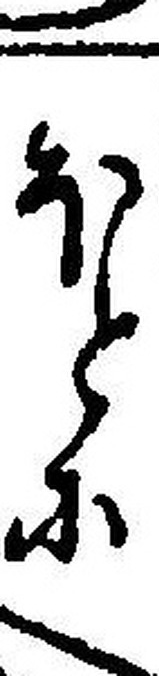ほとに
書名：どうれ百人一首 / 鹿都部真顔(狂歌堂)編
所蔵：東京大学総合図書館 General Library in the University of Tokyo, JAPAN
